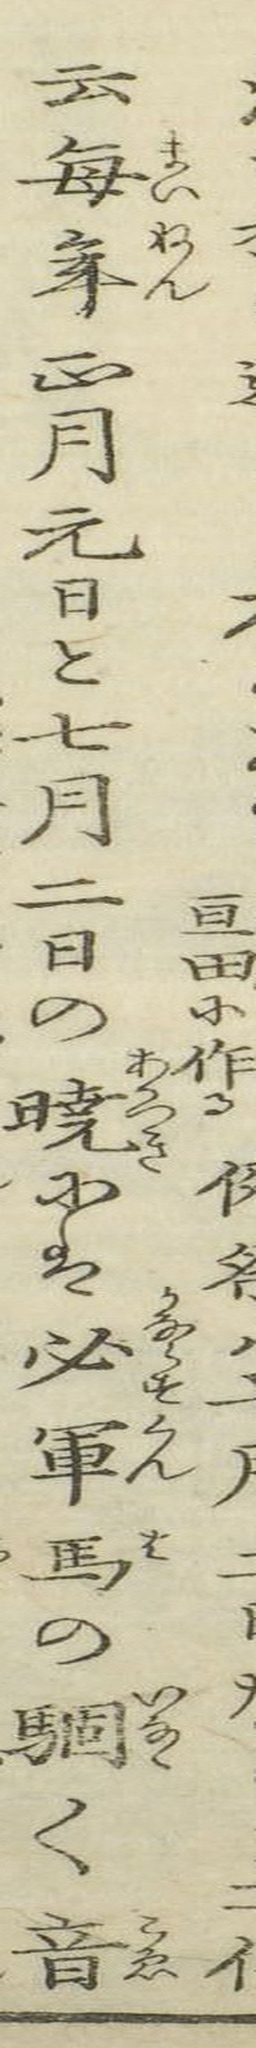云毎年正月元日と七月二日の暁には必軍馬のく音
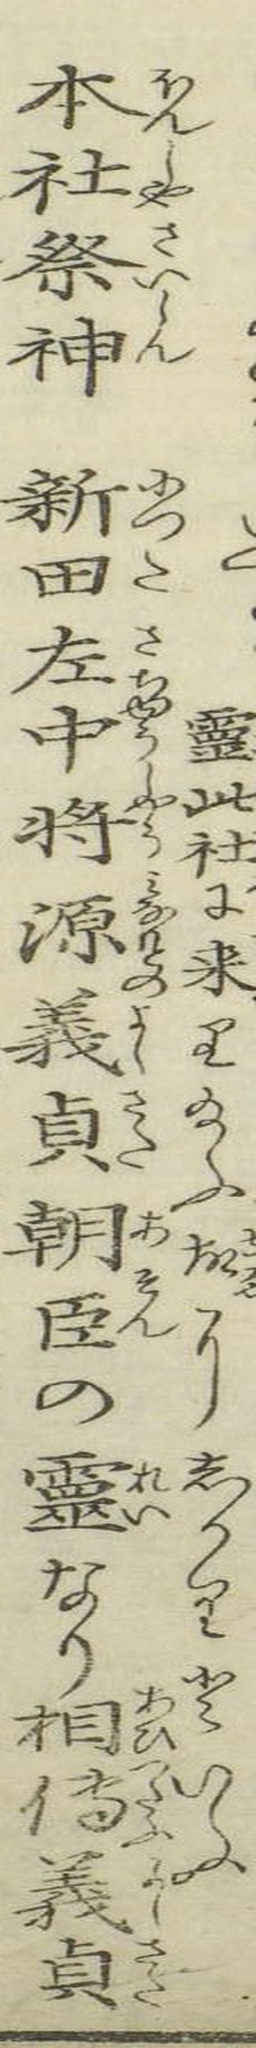本社祭神新田左中将源義貞朝臣の霊なり相傳義貞
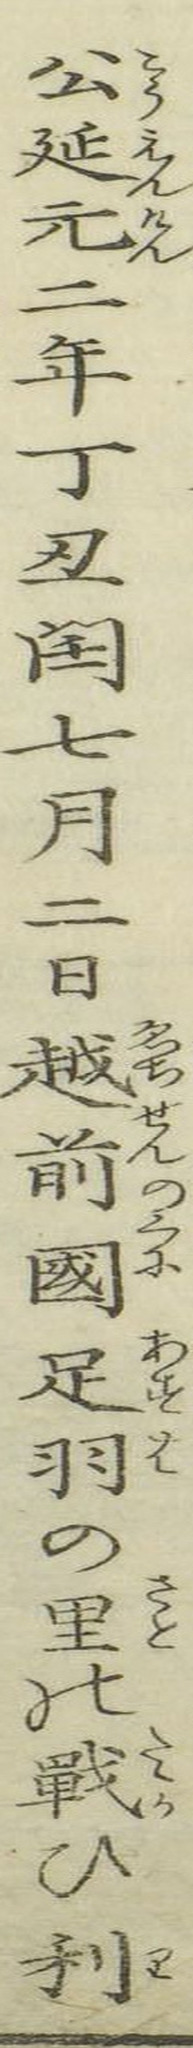公延元二年丁丑閏七月二日越前國足羽の里の戦ひ利
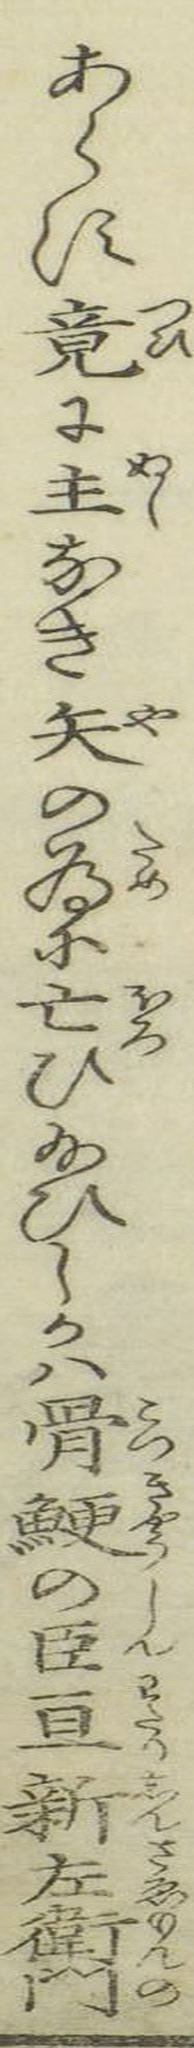あらす竟に主なき矢の為に亡ひ給ひしかは骨鯁の臣亘新左衛門

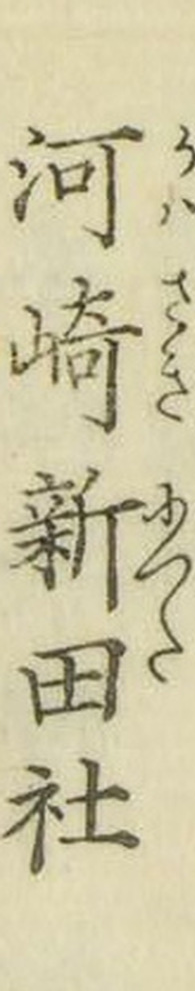河崎新田社
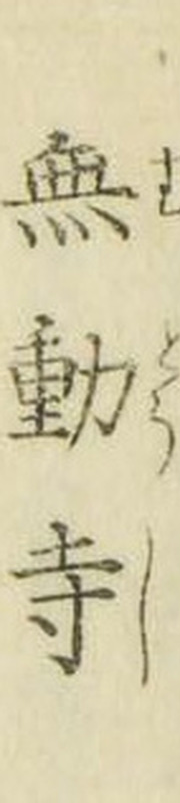無動寺
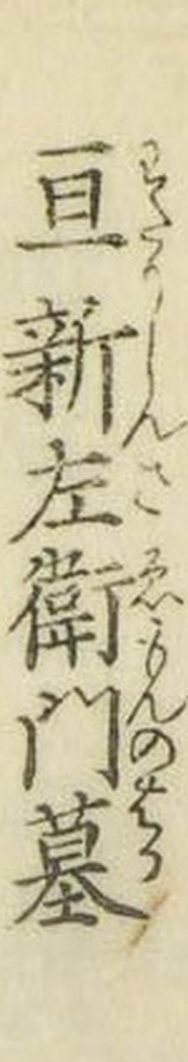亘新左衛門墓
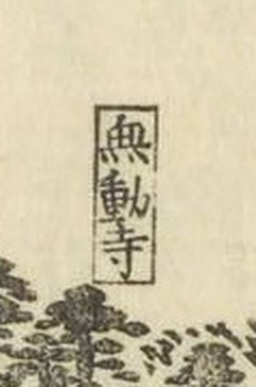無動寺

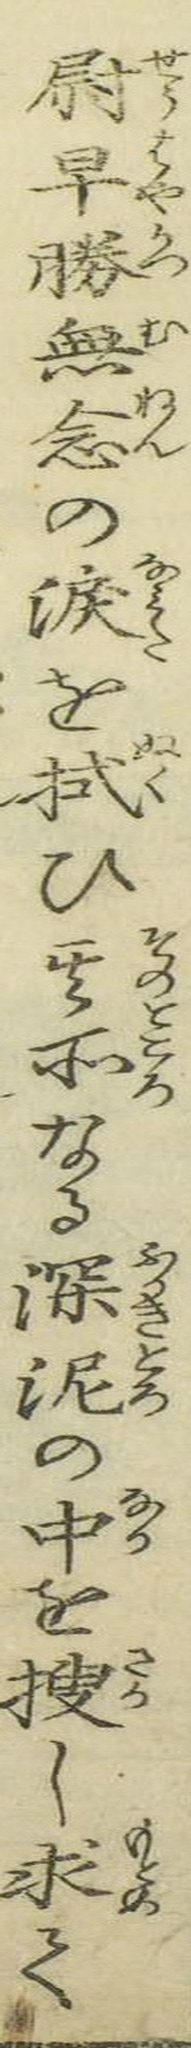尉早勝無念の涙を拭ひ其所なる深泥の中を捜し求て
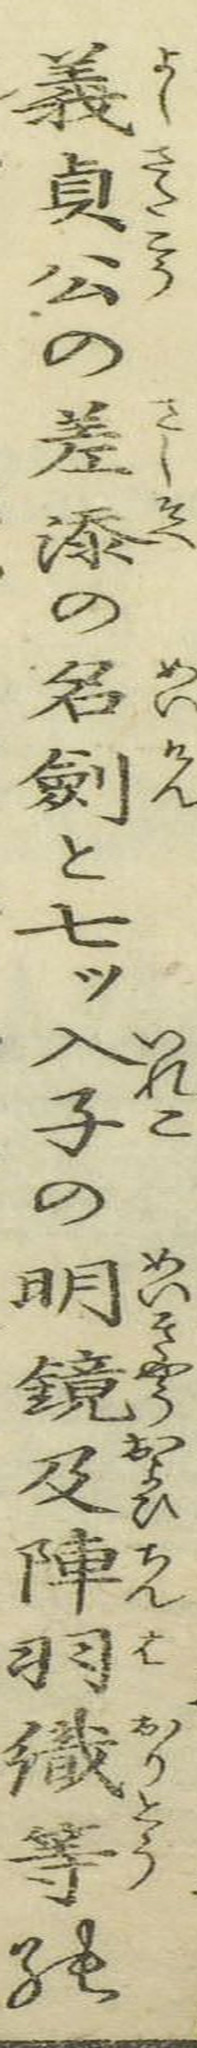義貞公の差添の名剣と七ッ入子の明鏡及陣羽織等の
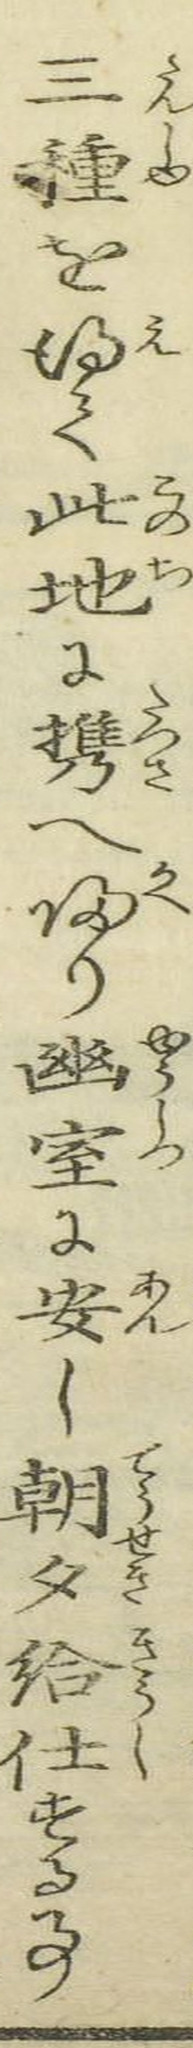三種を得て此地に携へ帰り幽室に安し朝夕給仕する事
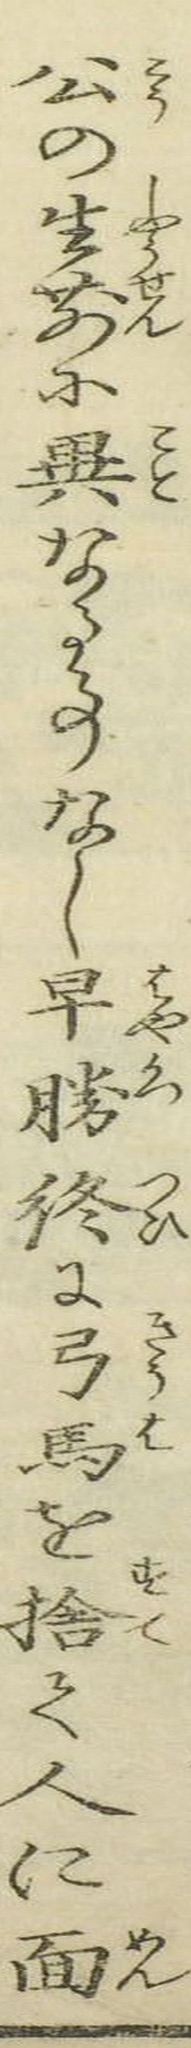公の生前に異なる事なし早勝終に弓馬を捨て人に面
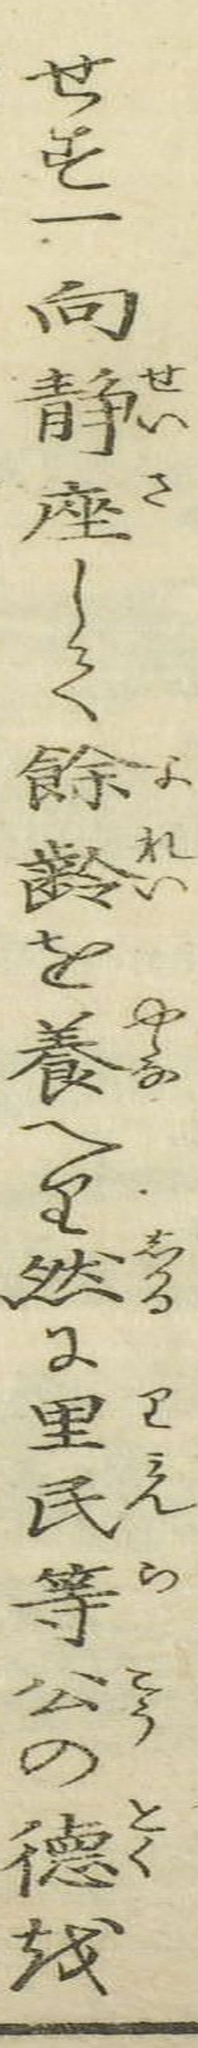せす一向静座して餘齢を養へり然に里民等公の德を
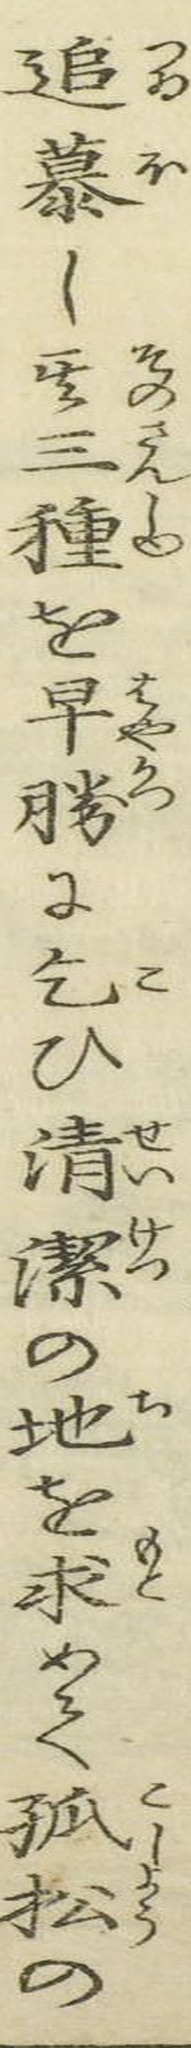追慕し其三種を早勝に乞ひ清潔の地を求めて孤松の
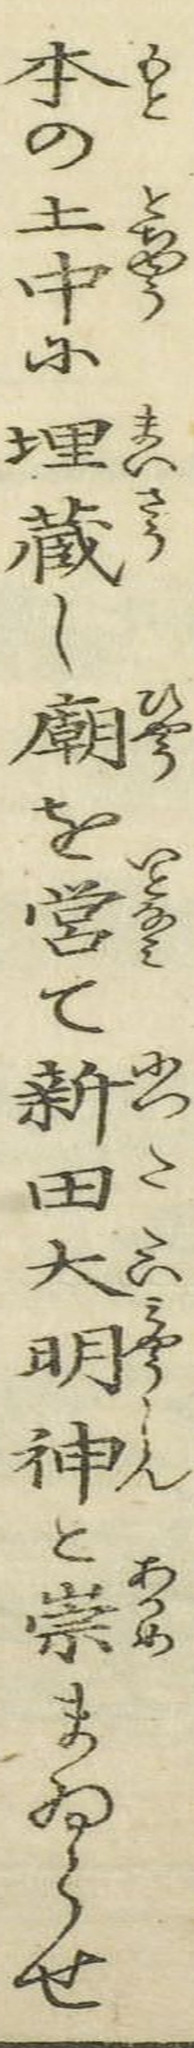本の土中に埋蔵し廟を営て新田大明神と崇まゐらせ
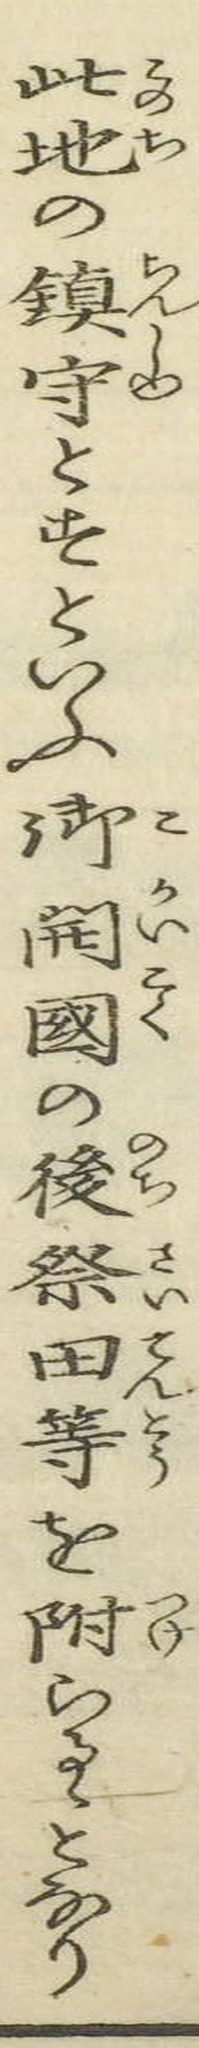此地の鎮守とすといふ御開國の後祭田等を附らるゝとなり
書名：江戸名所図会 20巻 巻之5
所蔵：東京学芸大学教育コンテンツアーカイブ
